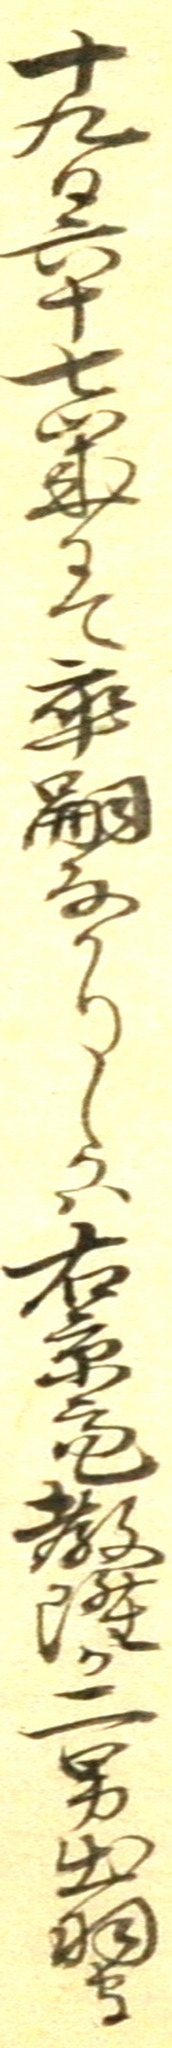十九日六十七歳にて卒嗣なかりしかは右京亮教隆か二男出羽守
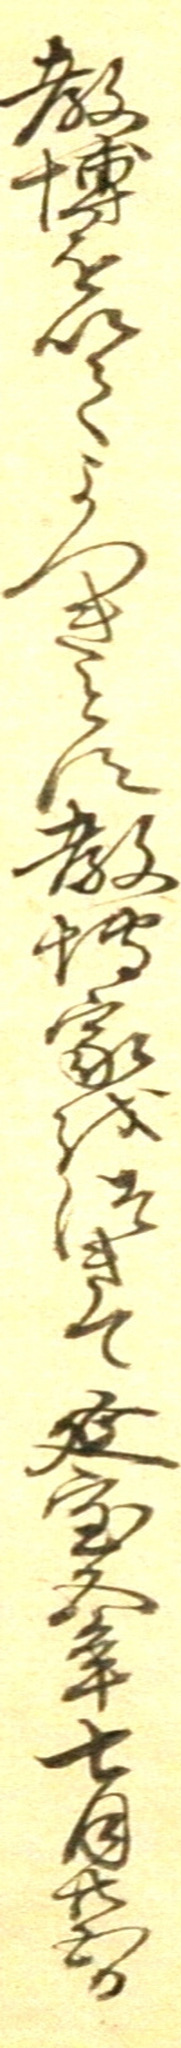教博を以てよつきとす教博家をつきて延宝五年七月廿五日
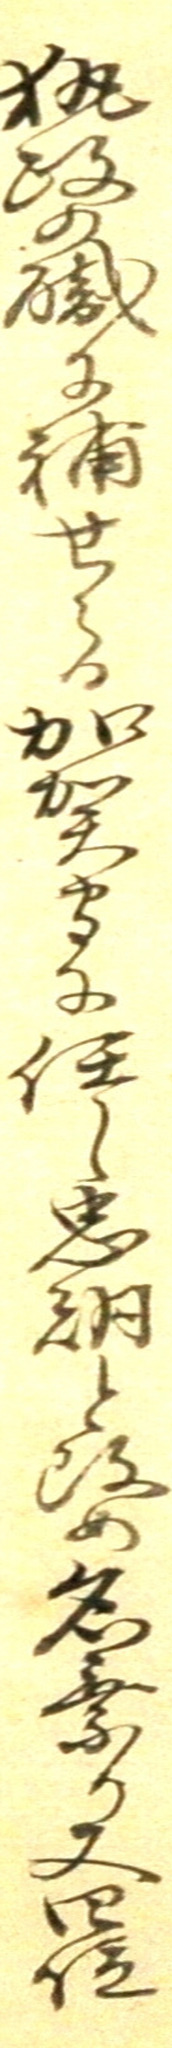執政の職に補せらる加賀守に任し忠朝と改め名乗り又四位
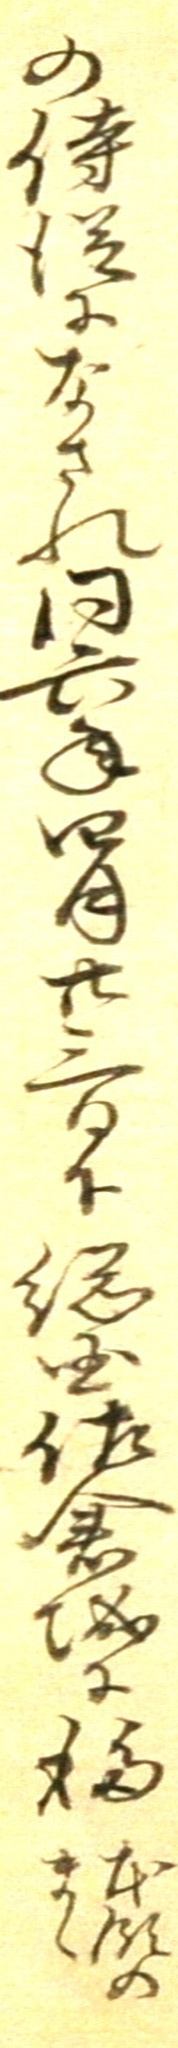の侍従になされ同六年四月廿三日下総国佐倉城に移本領のまゝ
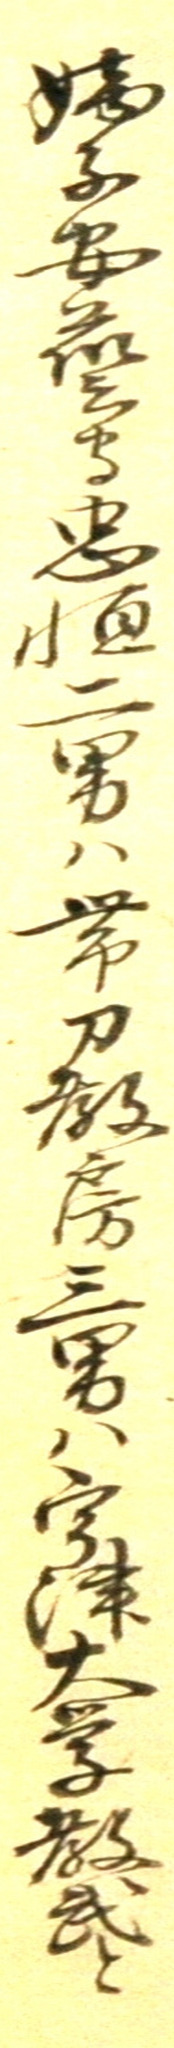嫡子安芸守忠恒二男は帯刀教房三男ハ宇津大学教武と

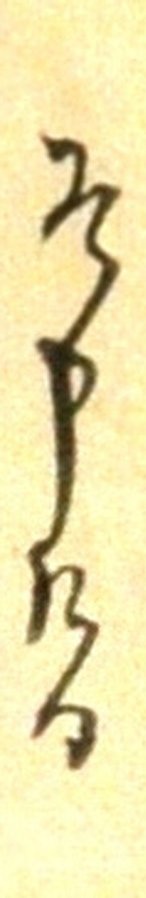そ申ける
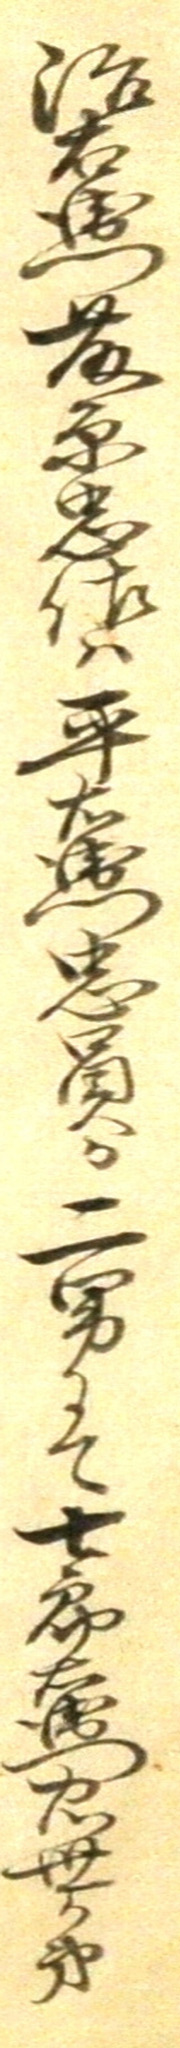治右衛門藤原忠佐は平右衛門忠員か二男にて七郎右衛門忠世か弟
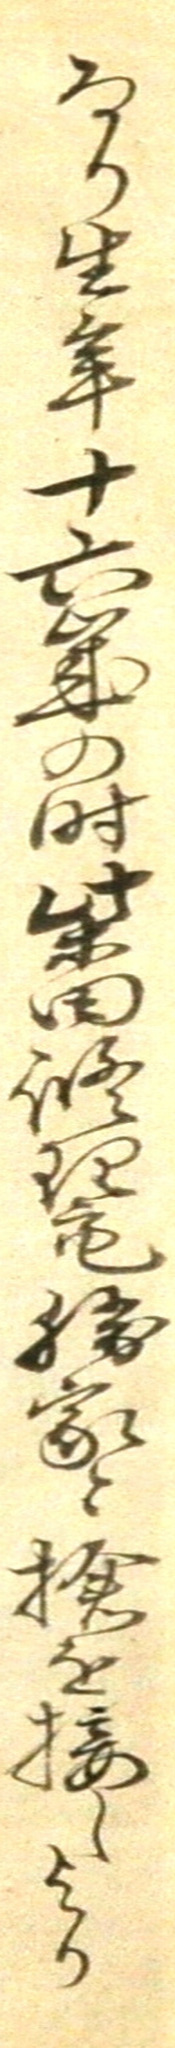なり生年十六歳の時柴田修理亮勝家と槍を接しより
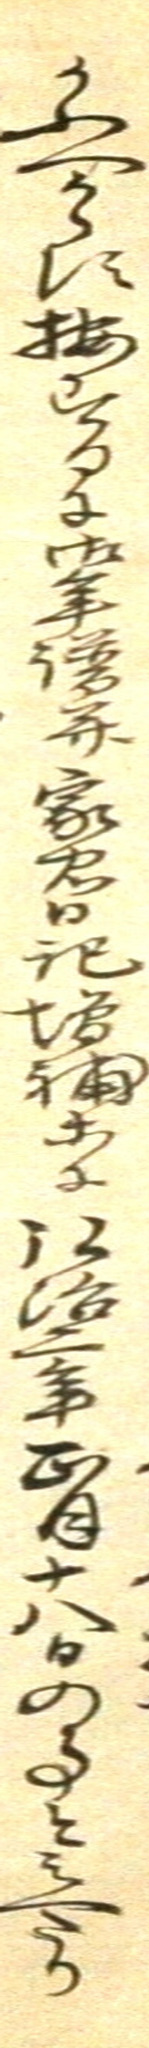かうへからす按するに御年譜幷家忠日記増補等に弘治二年正月十八日の事とみへたり
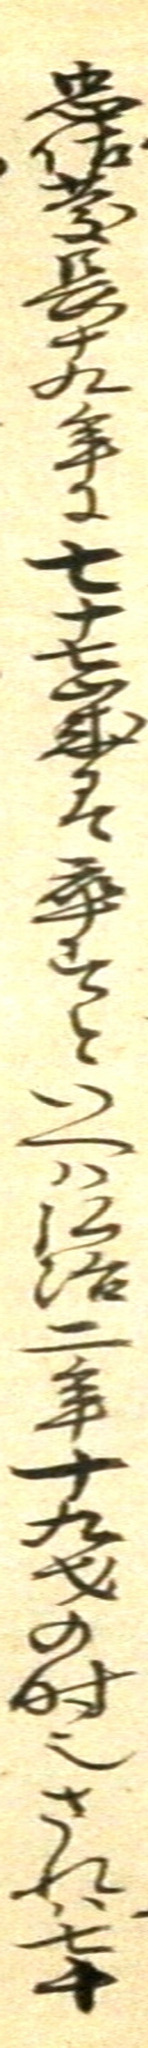忠佐慶長十九年に七十七歳にて卒すといへは弘治二年十九才の時也されは七十
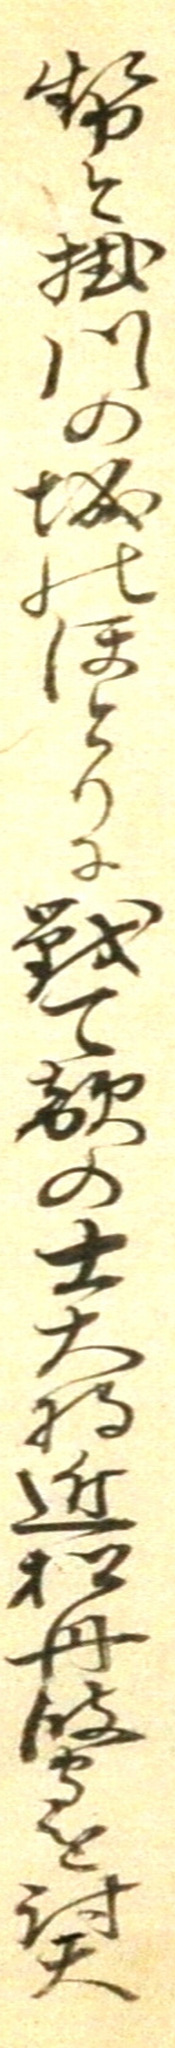勢と掛川の城のほとりに戦て敵の士大将近松丹波守を討天
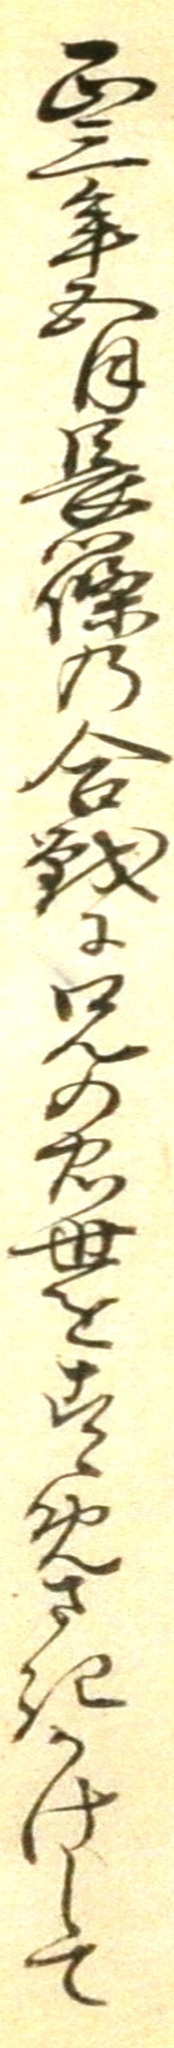正三年五月長篠の合戦に兄の忠世をすゝめさきかけして
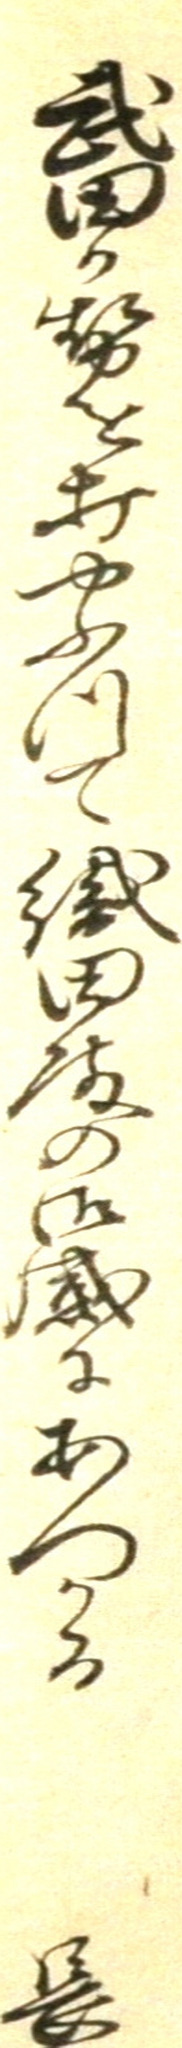武田か勢を打やふつて織田殿の御感にあつかる長湫の
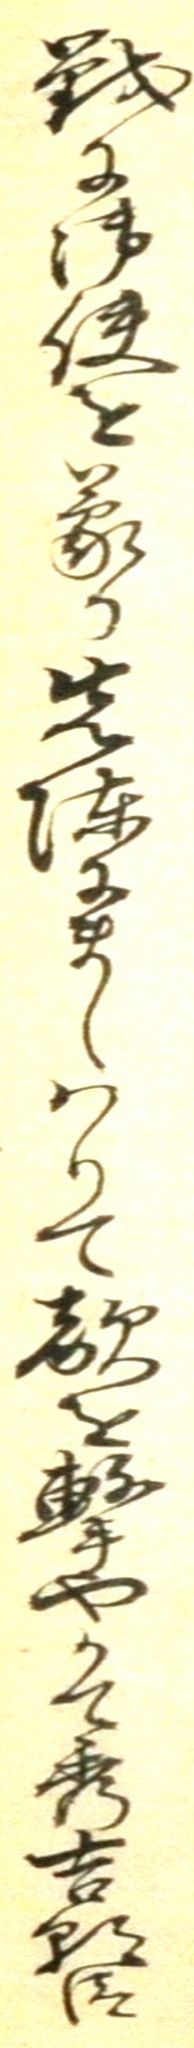戦に御使を蒙り先陣にましはりて敵を撃やかて秀吉朝臣
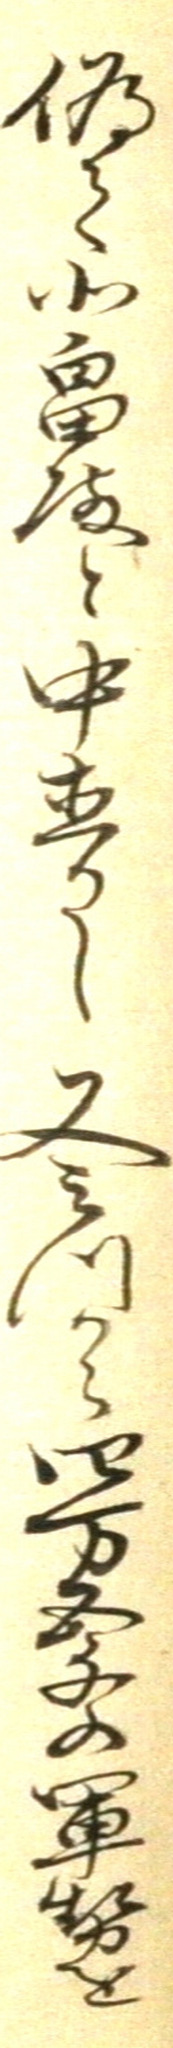偽て北畠殿と中直りし又みつから四万五千の軍勢を
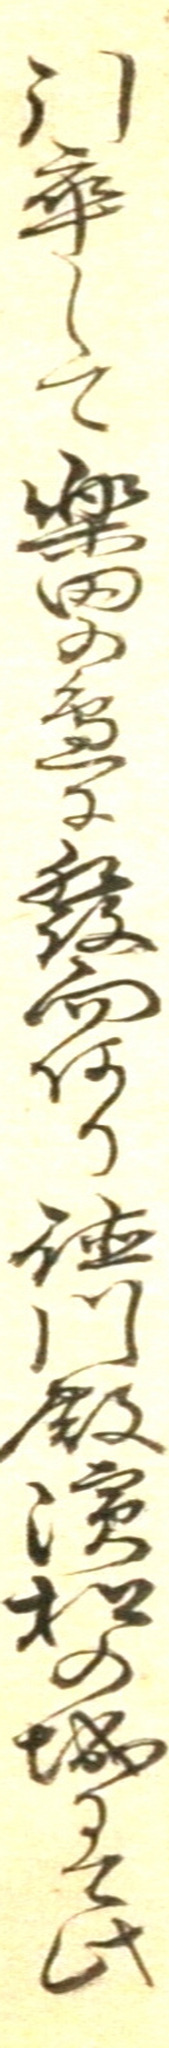引率して楽田の辺に発向あり徳川殿浜松の城にて此
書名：藩翰譜（四・中）
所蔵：伊那市立高遠町図書館・合同会社AMANE
